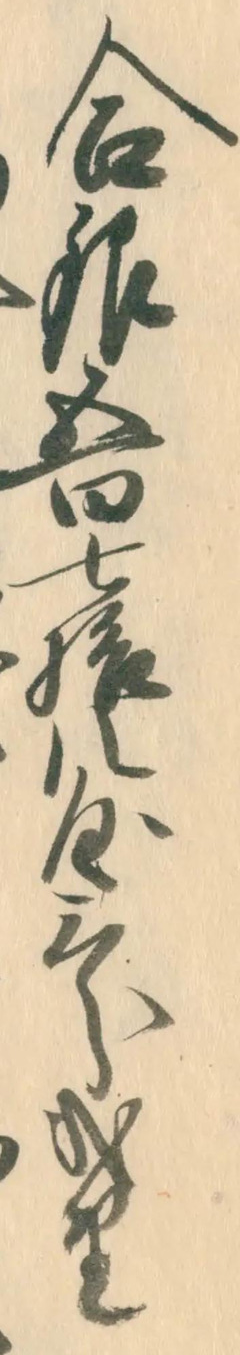合銀五百七拾八匁三分弐厘
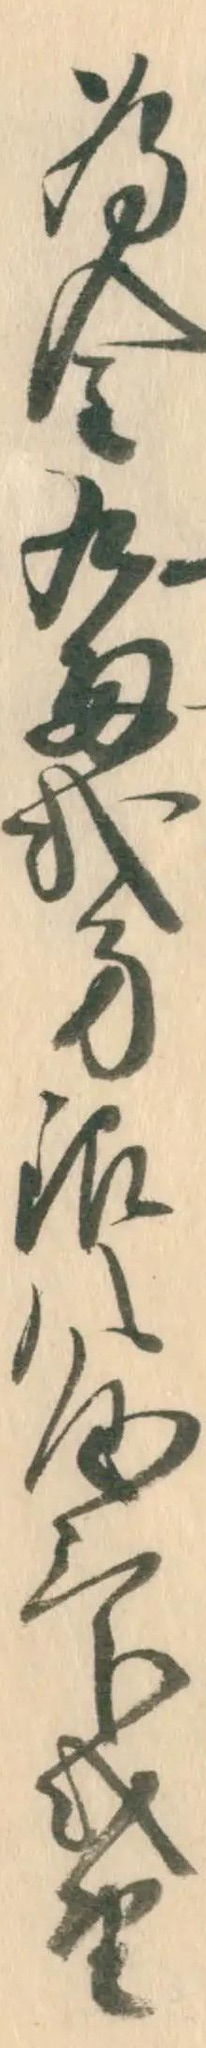為金九両弐分銀八匁三分弐厘
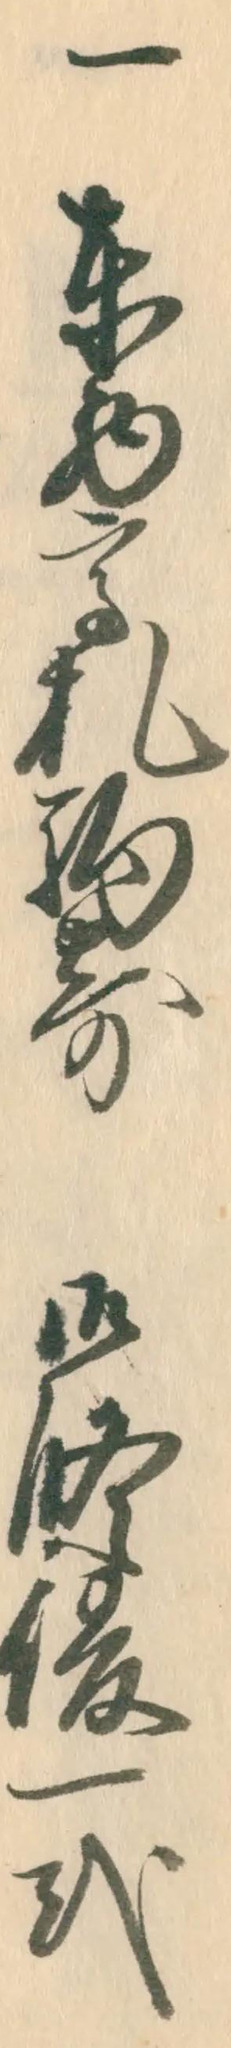一東西高札駒寄御修復一式
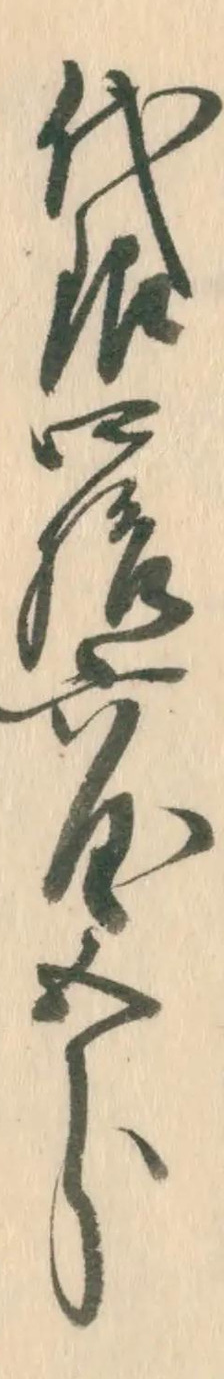代銀四拾六匁五分
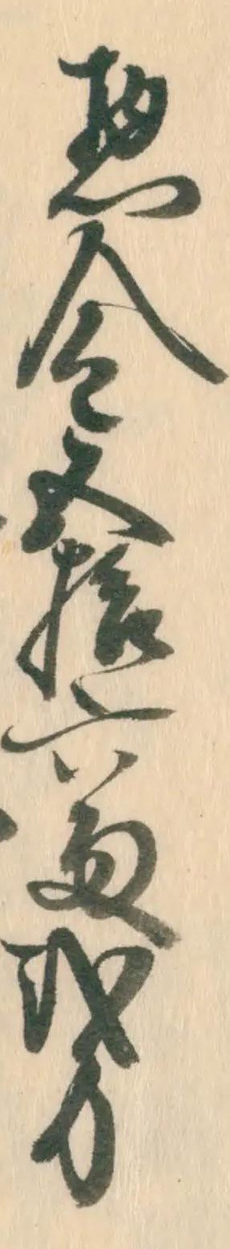惣金五拾六両弐分
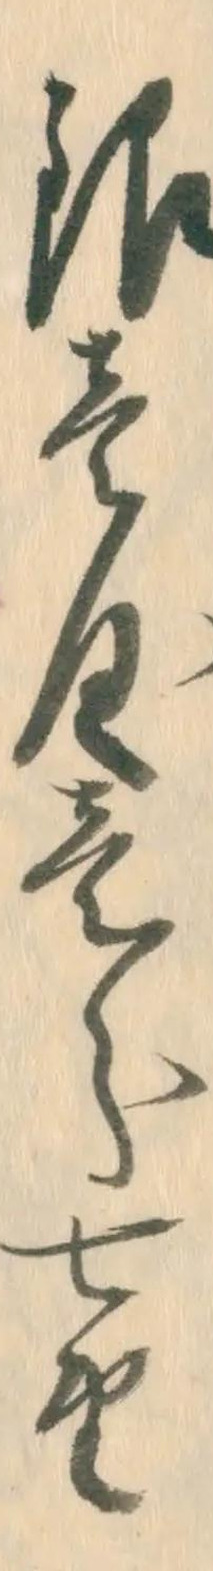銀壱匁壱分七厘
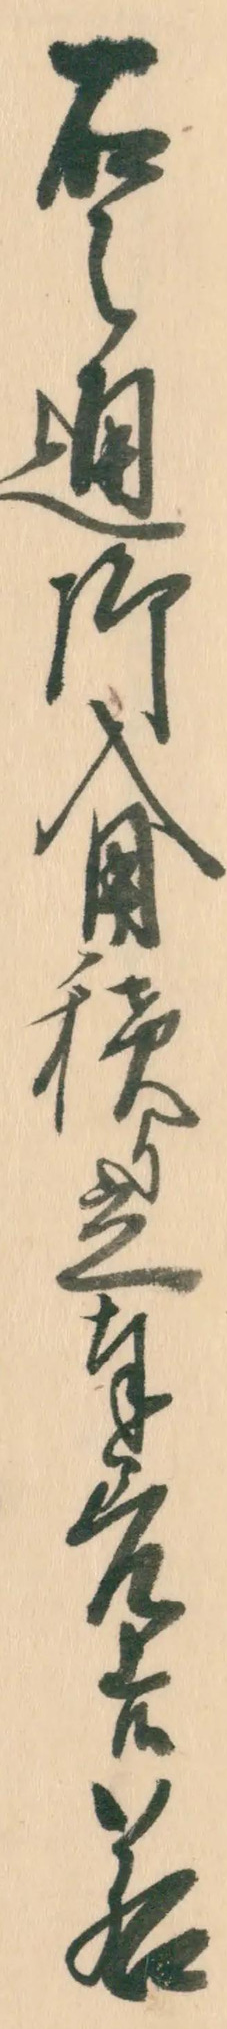右之通御入用積り立奉差上候若
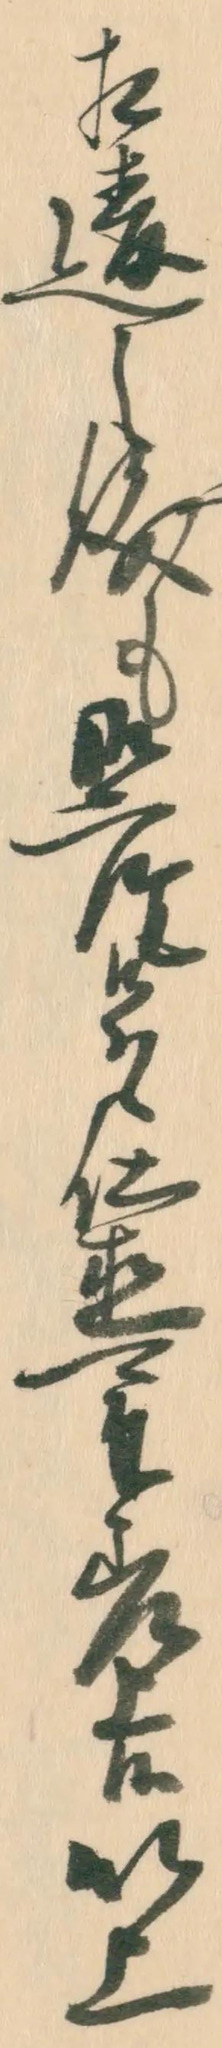相違之儀も御座候ハヽ仕直可奉差上候以上
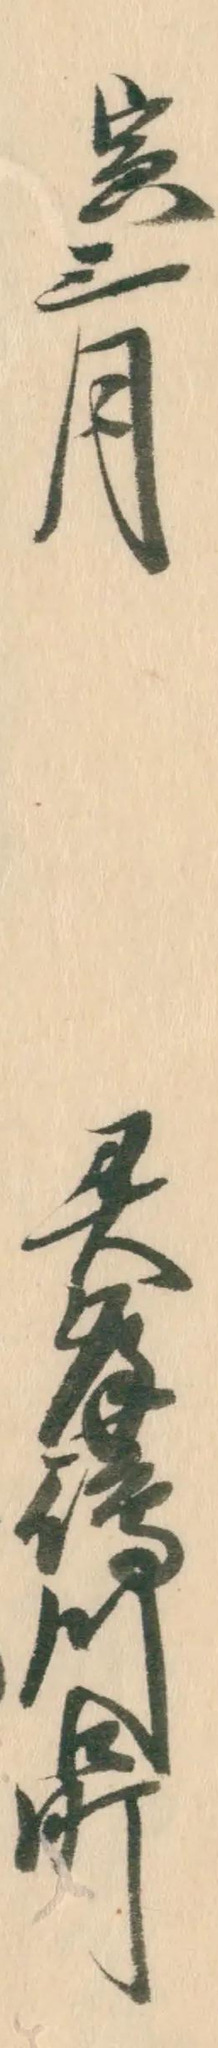寅三月霊岸島川口町
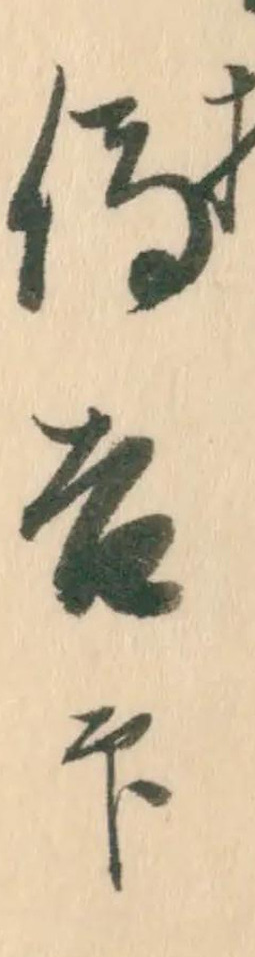伝吉印

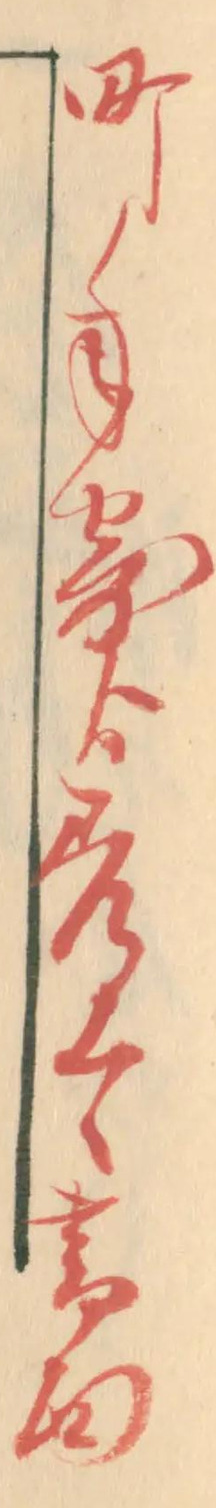町年寄ゟ差上候書面
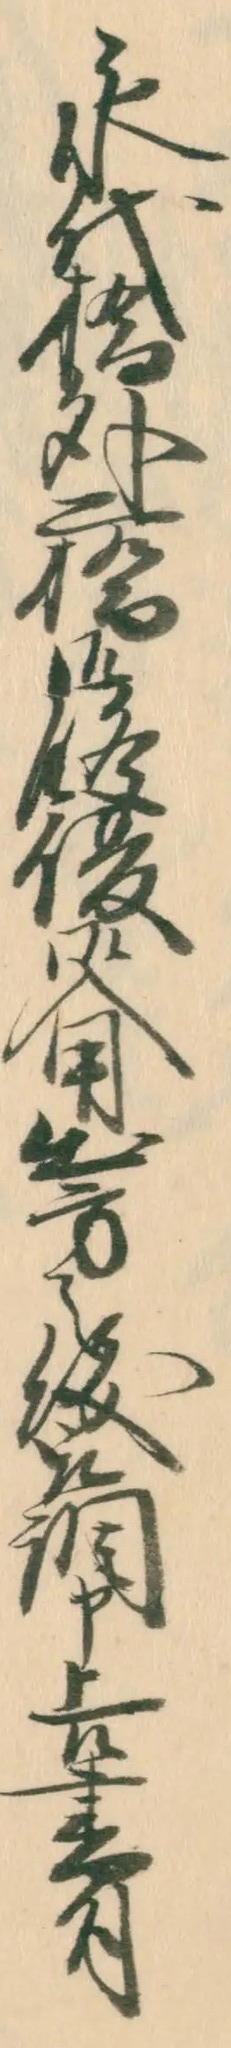永代橋外二橋御修復御入用出方之儀取調申上候書付
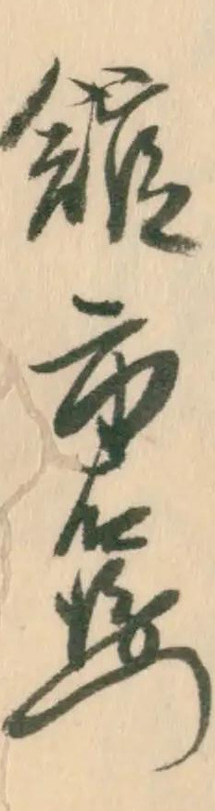館市右衛門
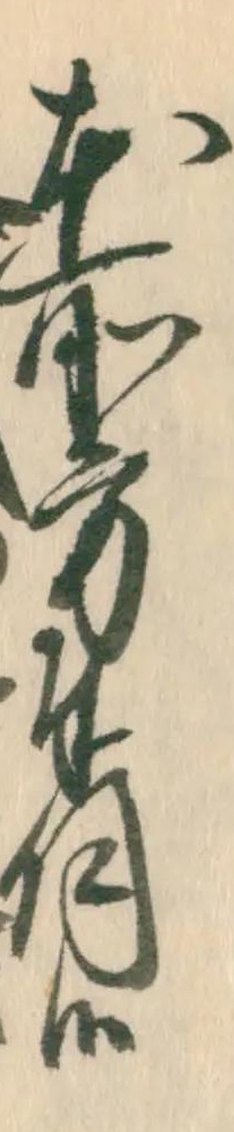本所方奉伺候
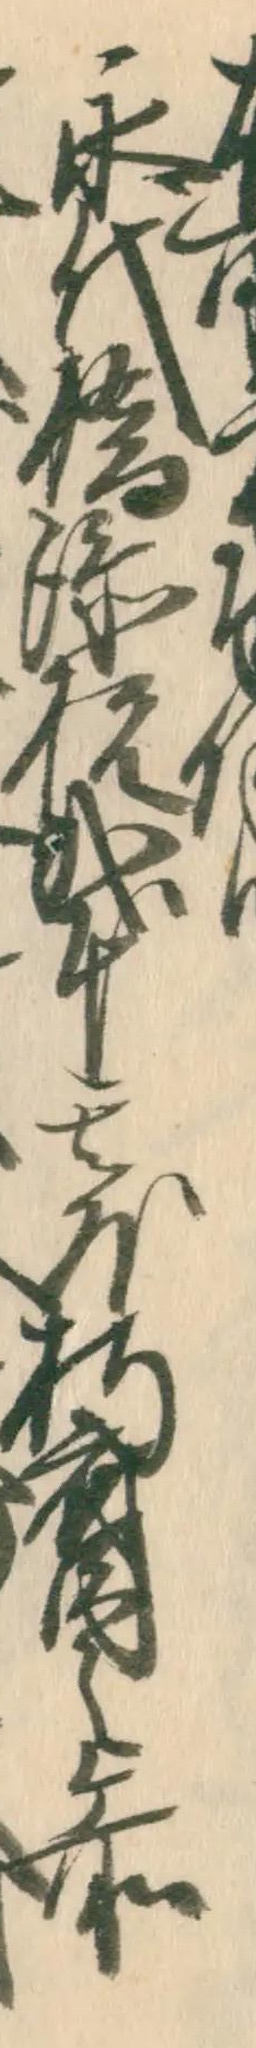永代橋添杭弐本其外朽腐之ケ所
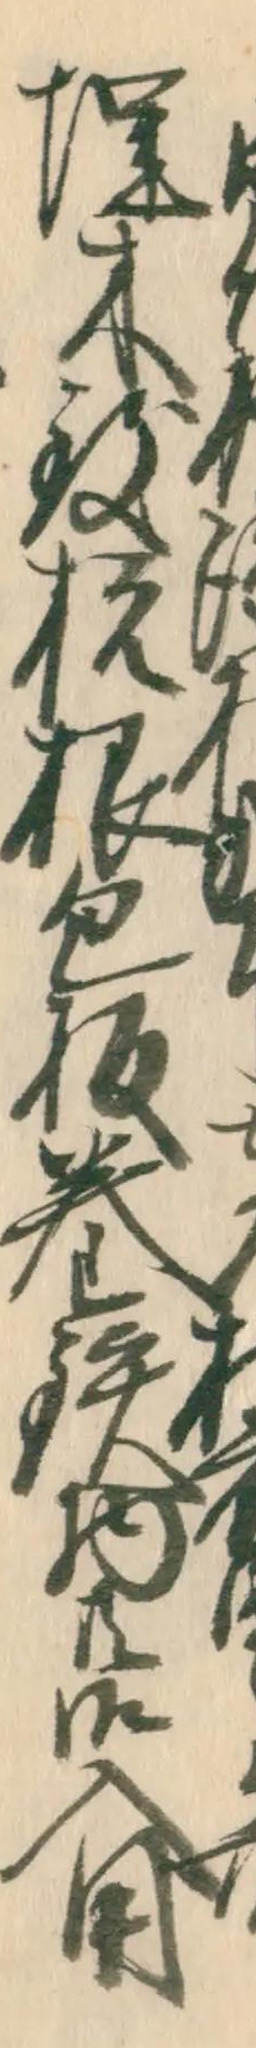埋木致杭根包板巻鉄物共御入用
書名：三橋 17巻. [8] 三橋小破御修復書留　但御奉行御掛リ替地震潰橋番屋　嘉永四亥年より安政二卯年迄　下
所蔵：国立国会図書館 National Diet Library, JAPAN
